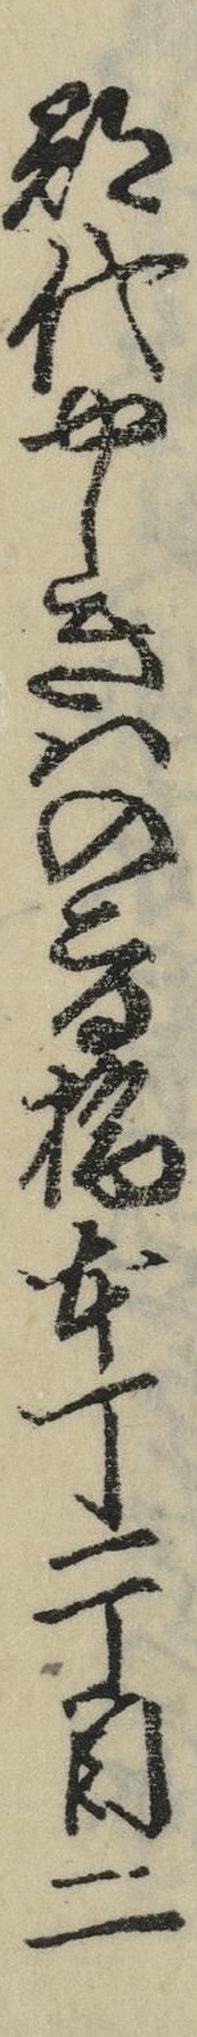郡代やしきはのこる橋本丁一丁目二
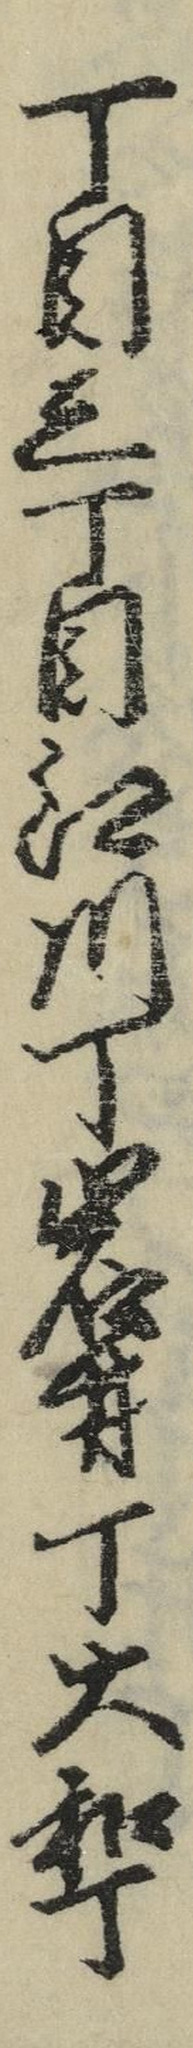丁目三丁目江川丁岩井丁大和丁
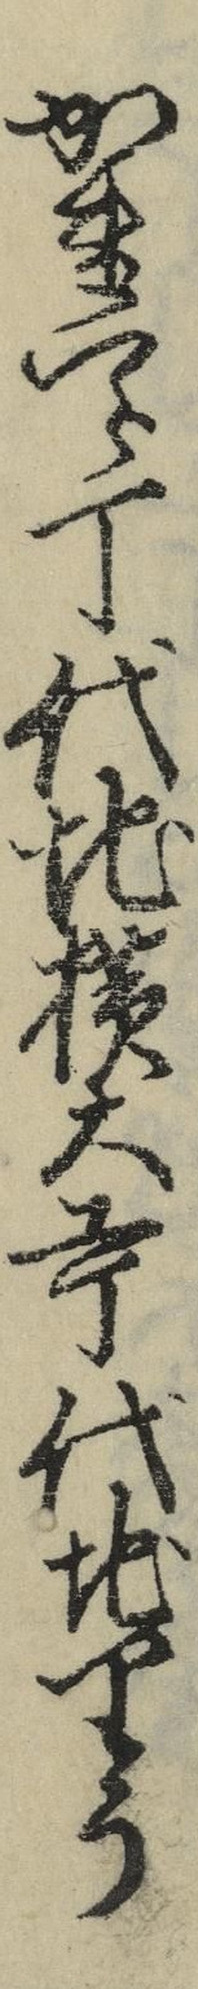かまいら丁代地横大工丁地りう
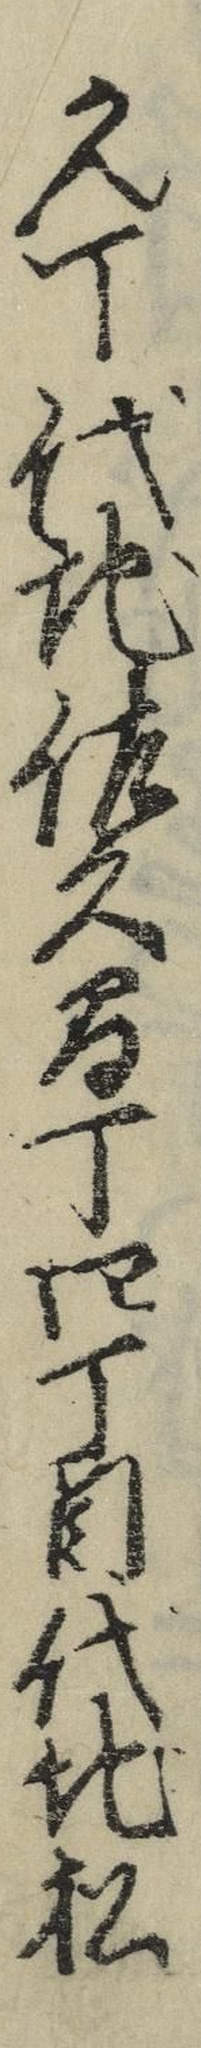かん丁代地佐久間丁四丁目代地松
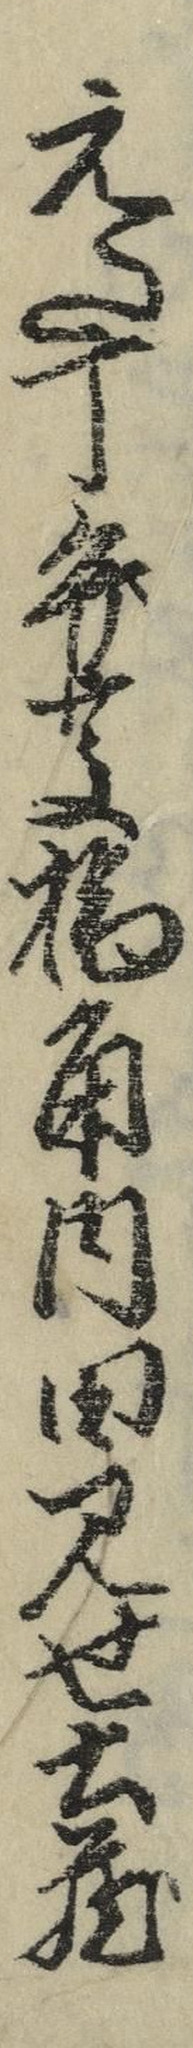えた丁弁慶橋角内田見せ土蔵
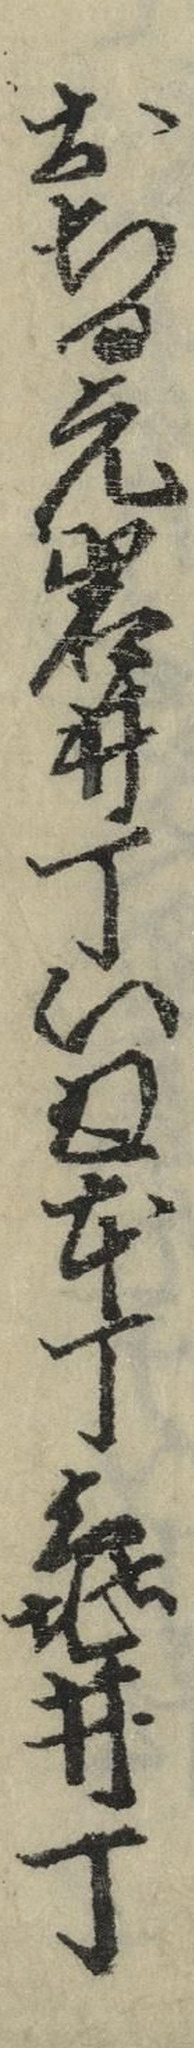おちる元岩井丁いわ本丁亀井丁
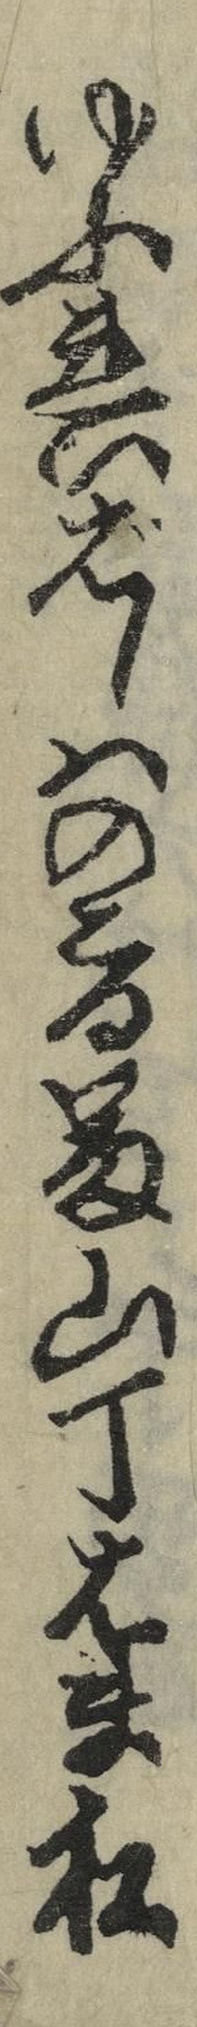ゆふれいばしはのこる富山丁はま松

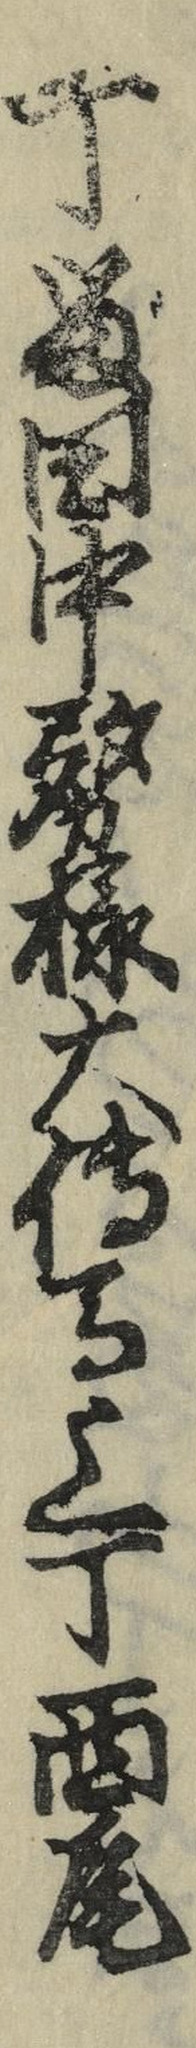丁当田中務様大伝馬上丁西尾
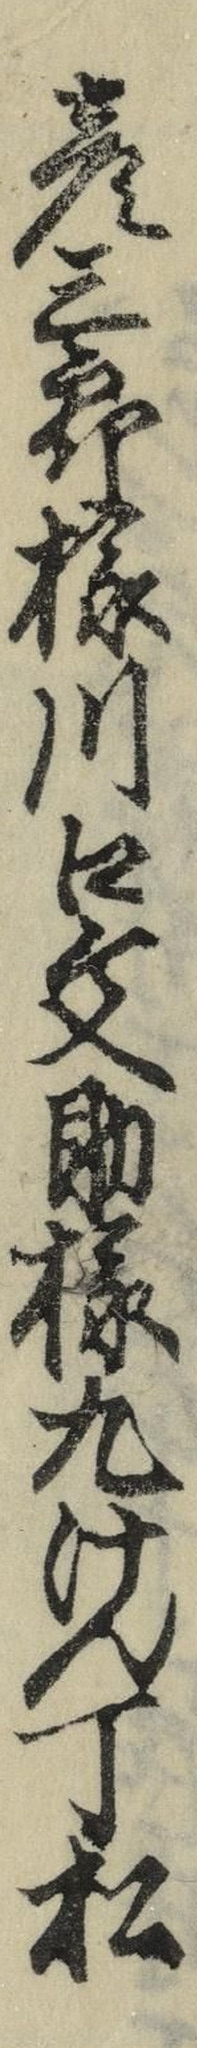彦三郎様川口文助様九けん丁松
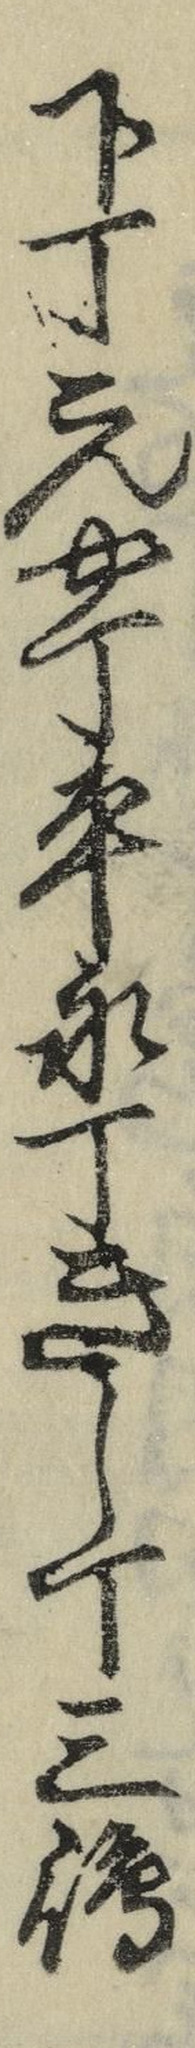下丁こんや丁平永丁きし丁三嶋
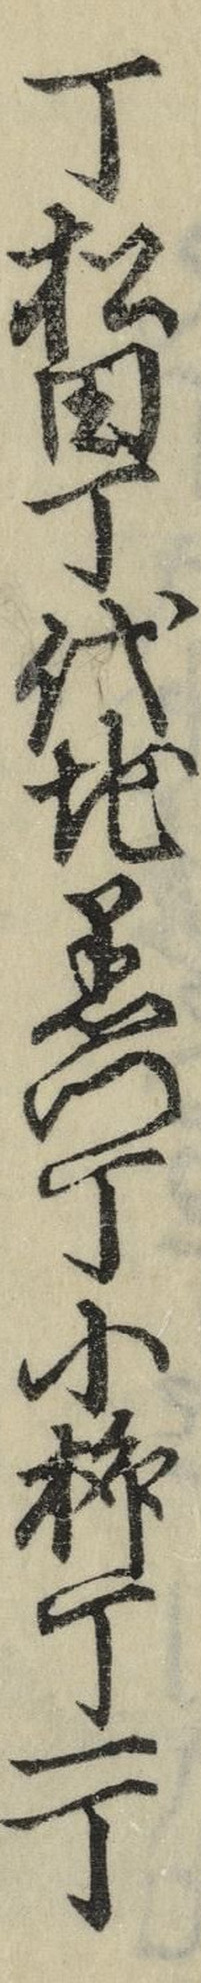丁松田丁代地黒門丁小柳丁一丁
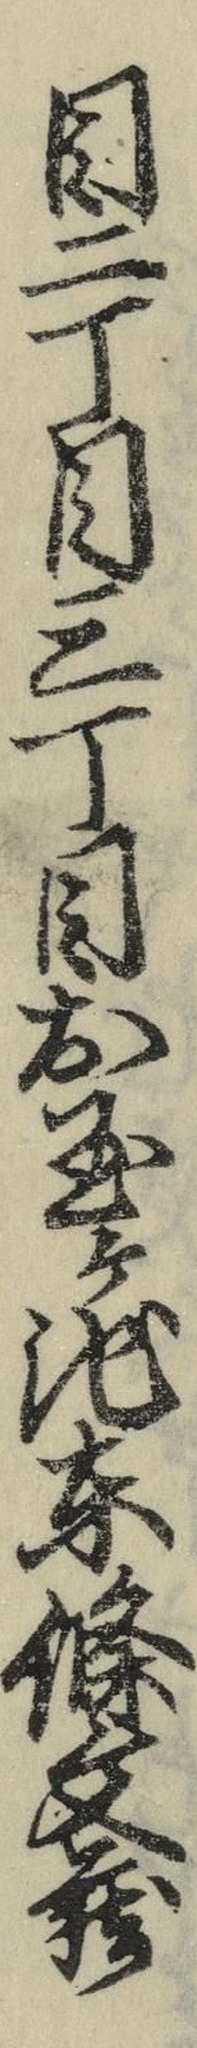目二丁目三丁目お玉ヶ池東条文蔵
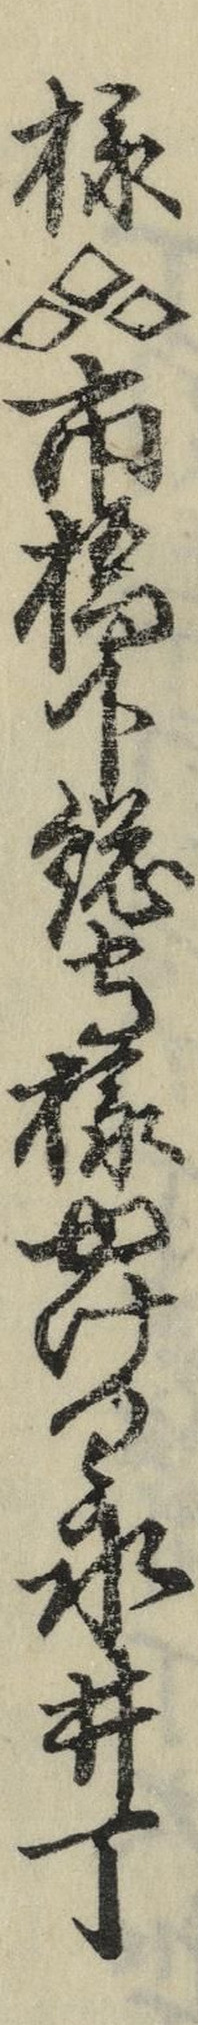様市橋下総守様やける永井丁
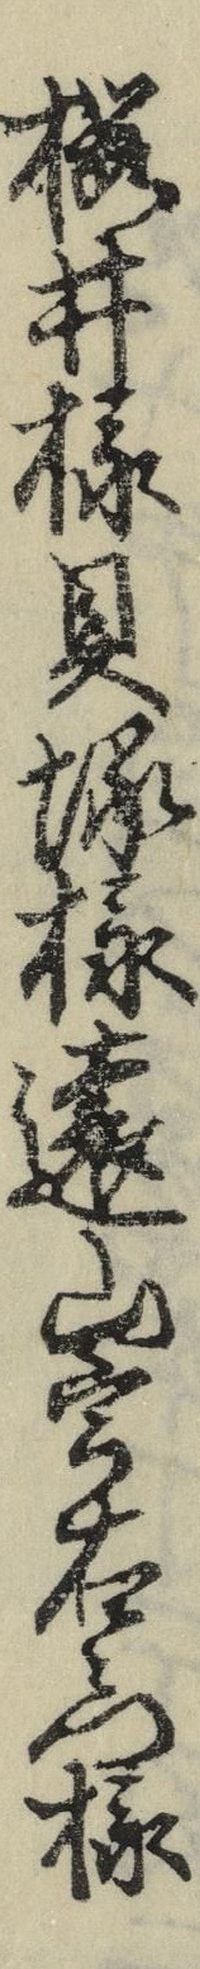桜井様貝塚様遠山宇右衛門様
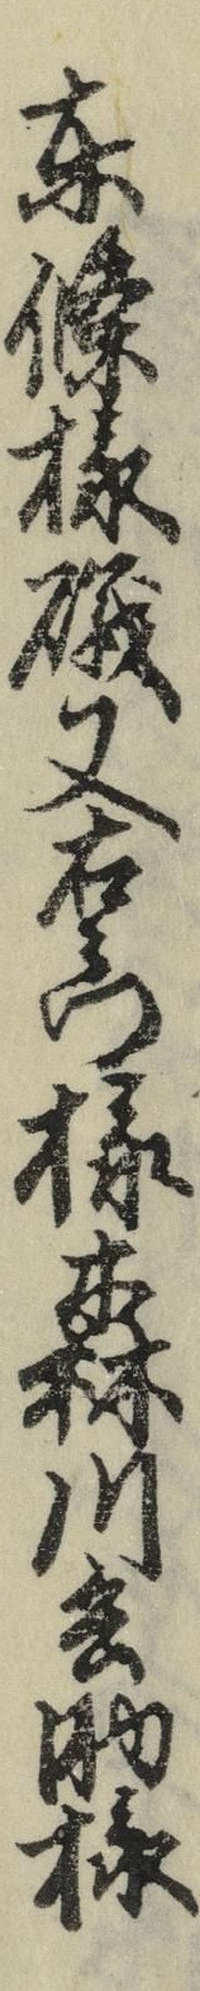東条様礒又右衛門様森川兵助様
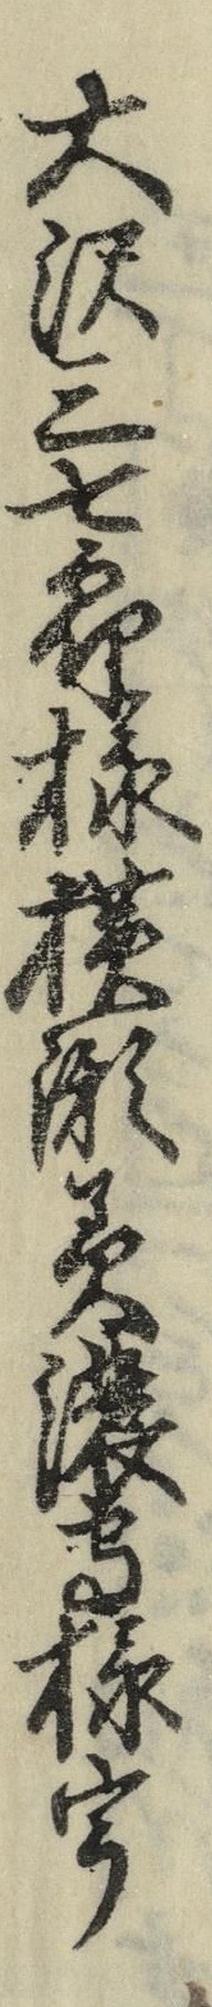大沢三七郎様横瀬美濃守様宇
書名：大江戸焼場所明細之写　附出火方角画圖　戊午安政五年十一月十五日
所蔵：東京大学地震研究所図書室 Earthquake Research Institute Library, The University of Tokyo, JAPAN
